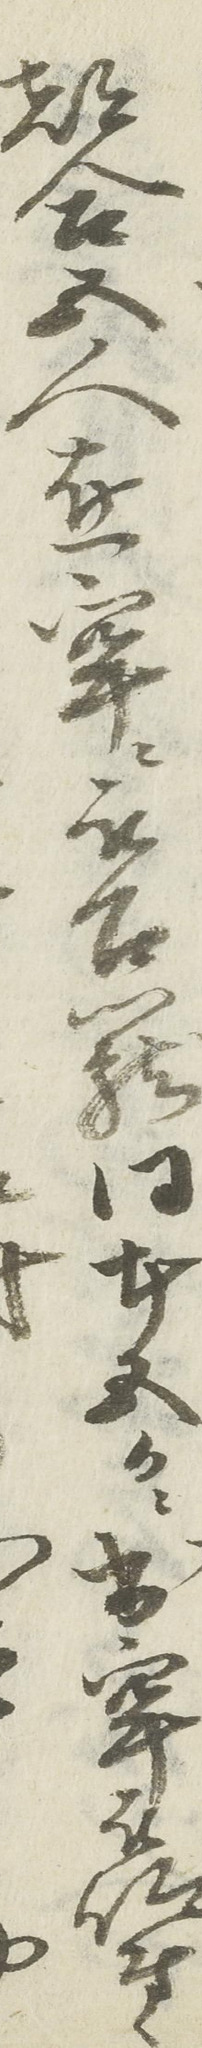都合五人在牢ニ被召寵同廿五日ニ出牢被仰付候
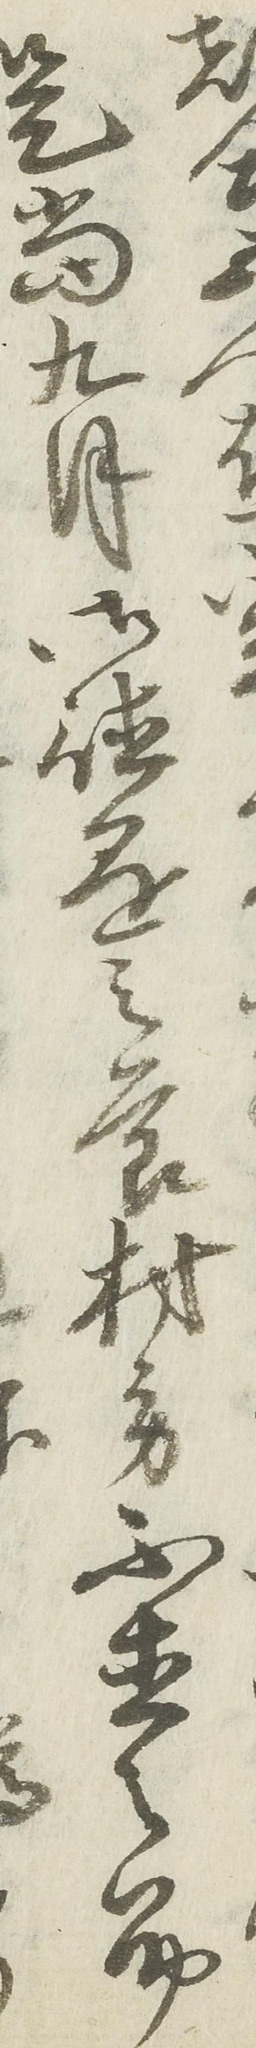是当九月御徳懸之節村方不直之筋
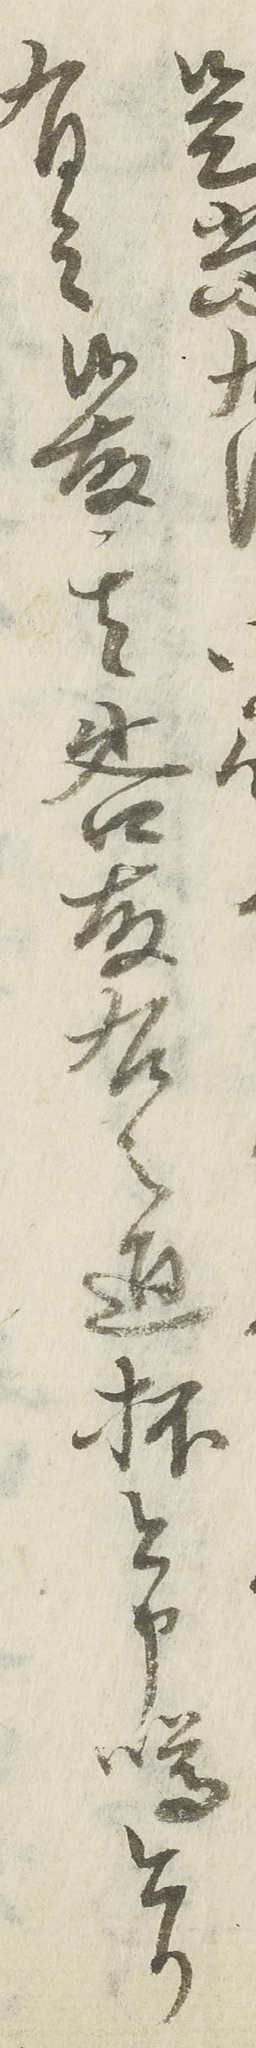有之候故其咎故右之通抔と申噂とか
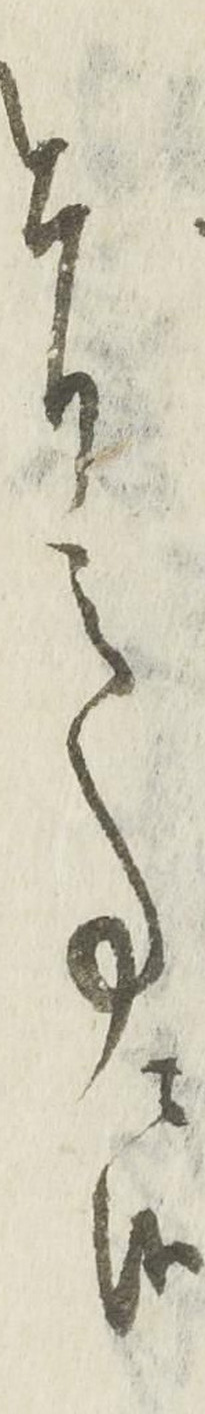とか之事ニ候
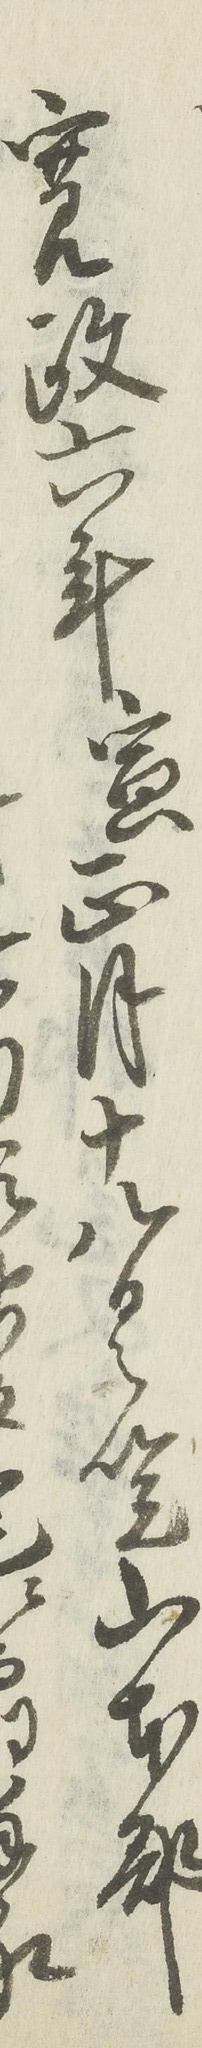一寛政六年寅正月十八日之晩山本郡
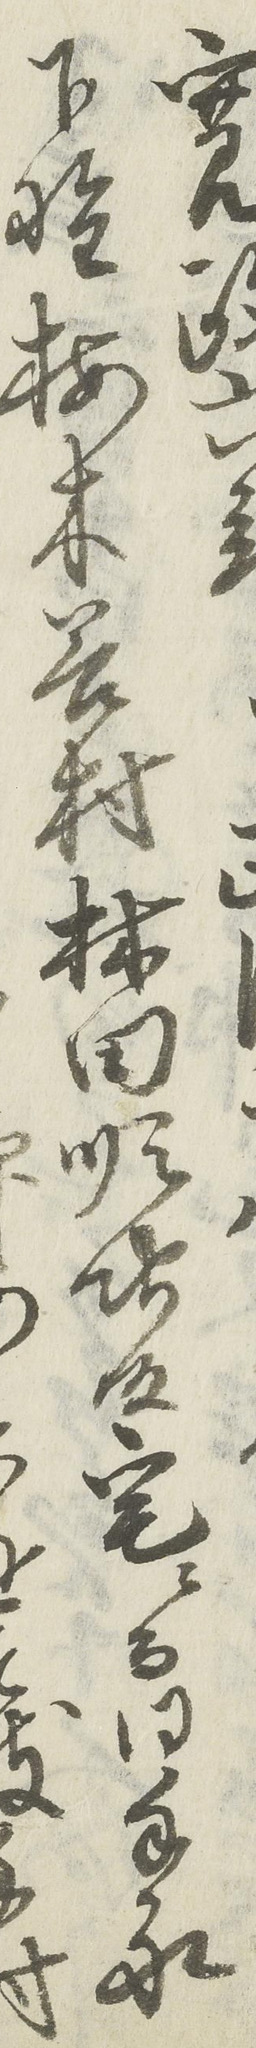下野梅木谷村林田順次殿宅ニ而同手永
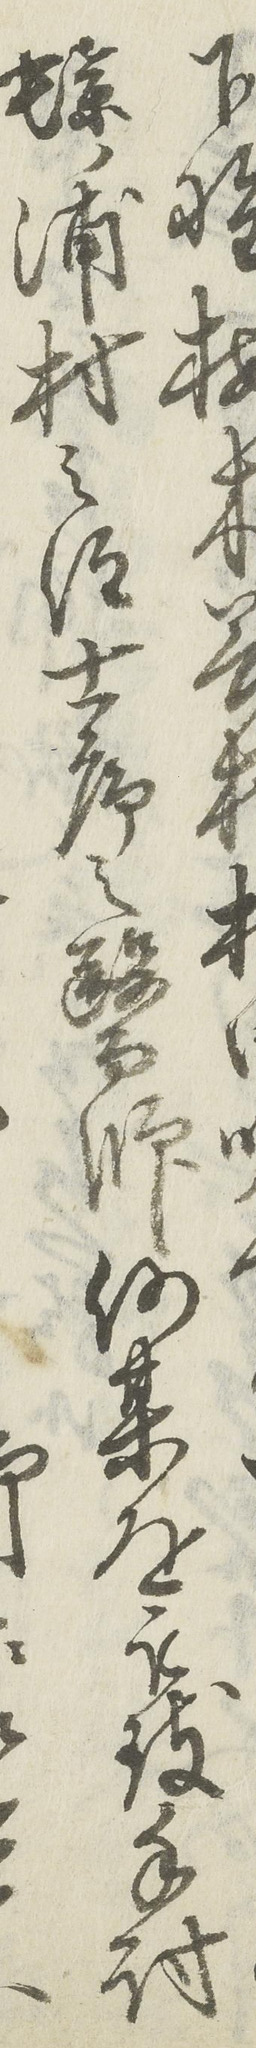蝶ノ浦村之住士郎之医師何某を被致手討
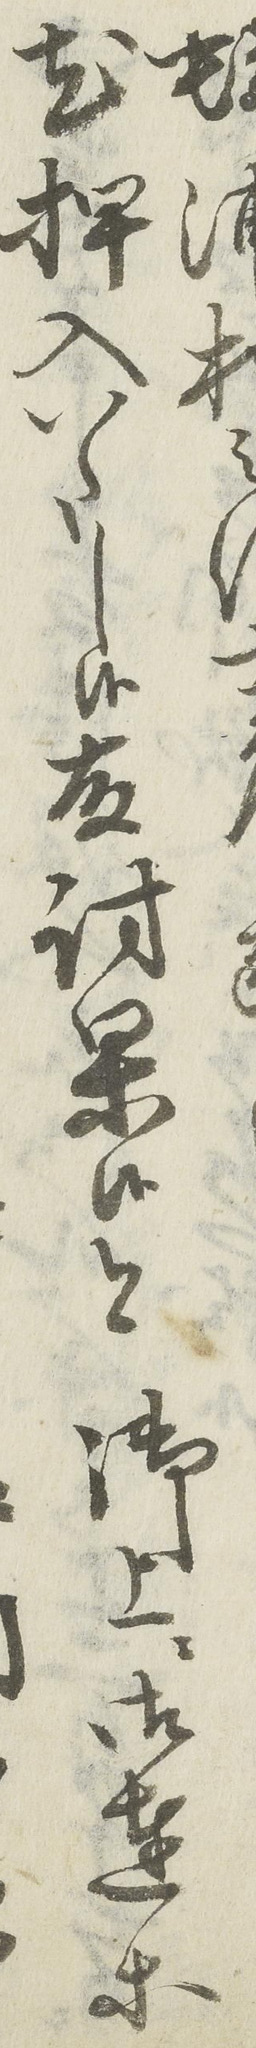尤押入いたし候故討果候と御上ニ御達等
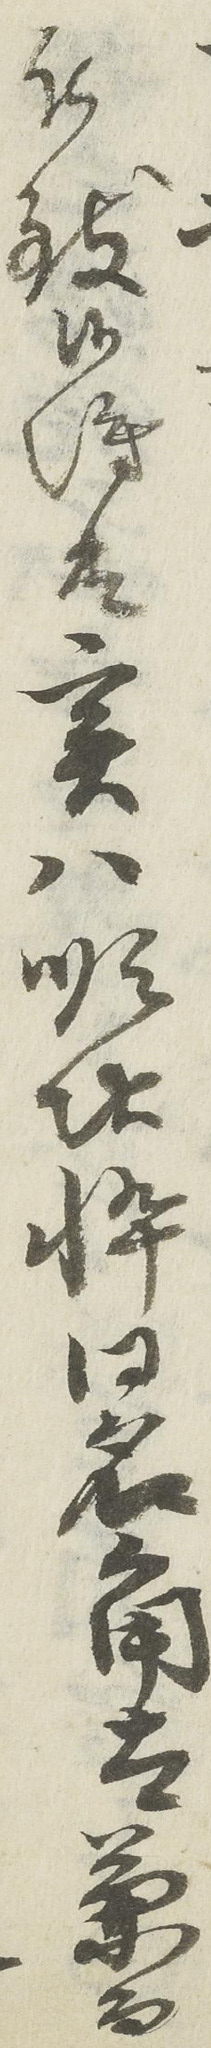被致候得共実は順次倅同名角太兼而
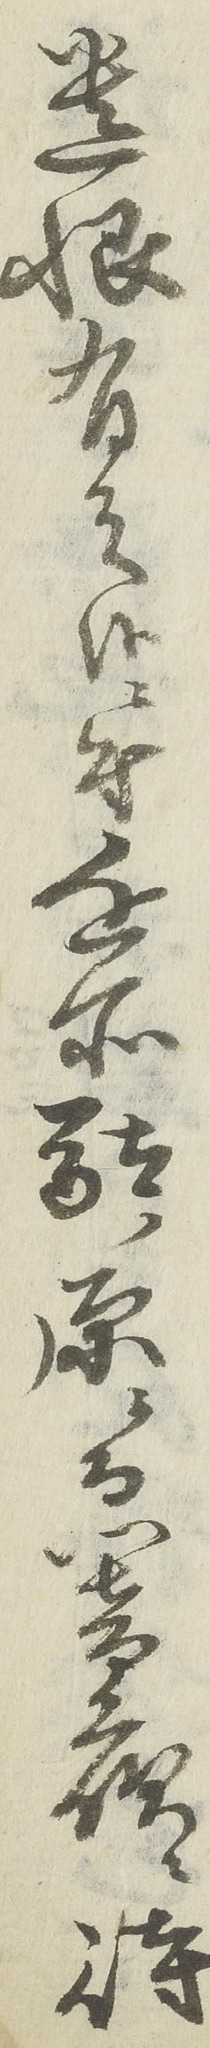遺恨有之候ニ付近所駄ノ原ニ而闇夜ニ待

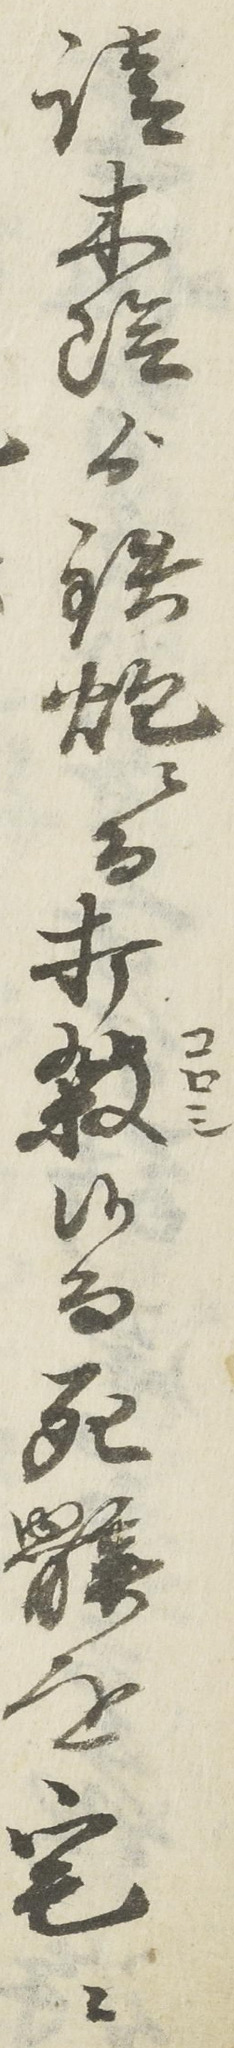請木陰ゟ鉄砲ニ而打殺候而死骸を宅ニ
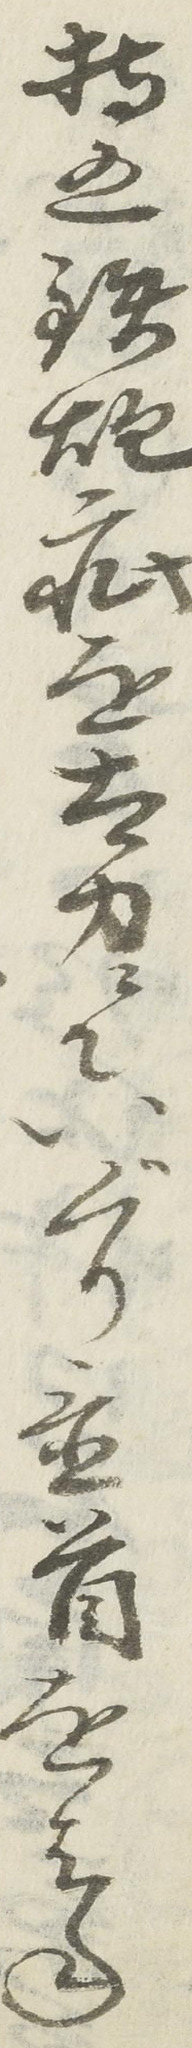持込鉄砲疵を太刀ニていぐり置首をはね
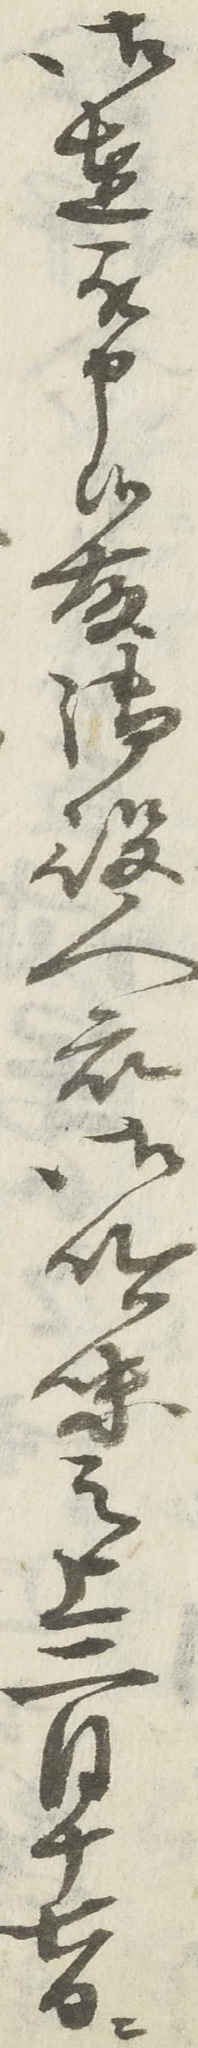御達被申候故御役人衆御吟味之上二月十七日ニ
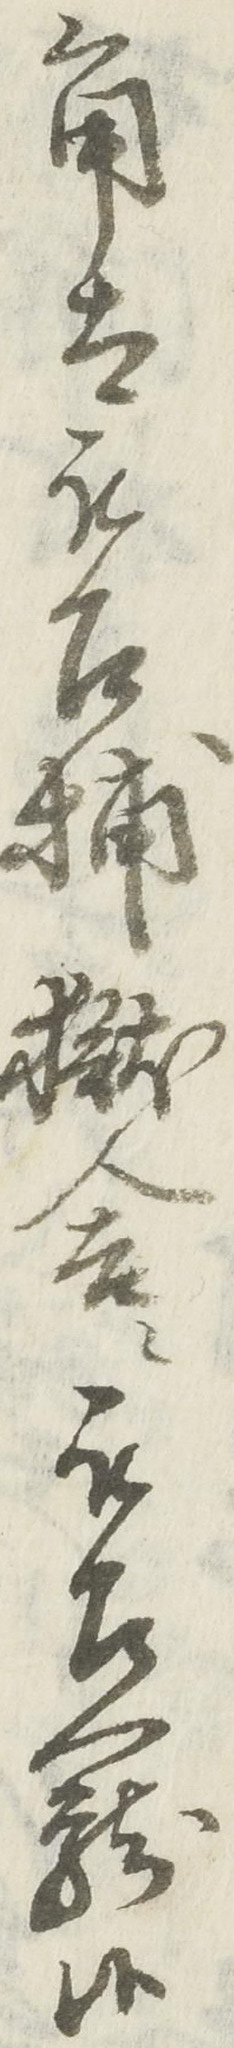角太被召捕獄舎ニ被召寵候
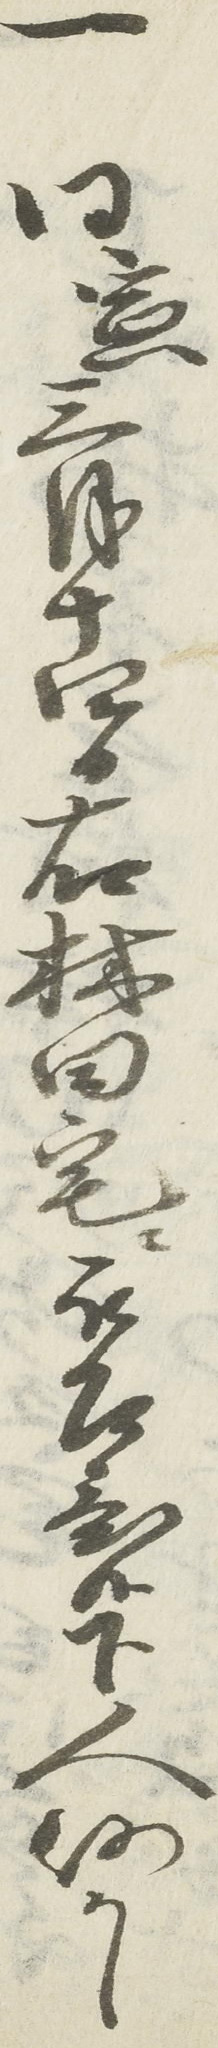一同寅三月十四日右林田宅ニ被召置候下人何かし
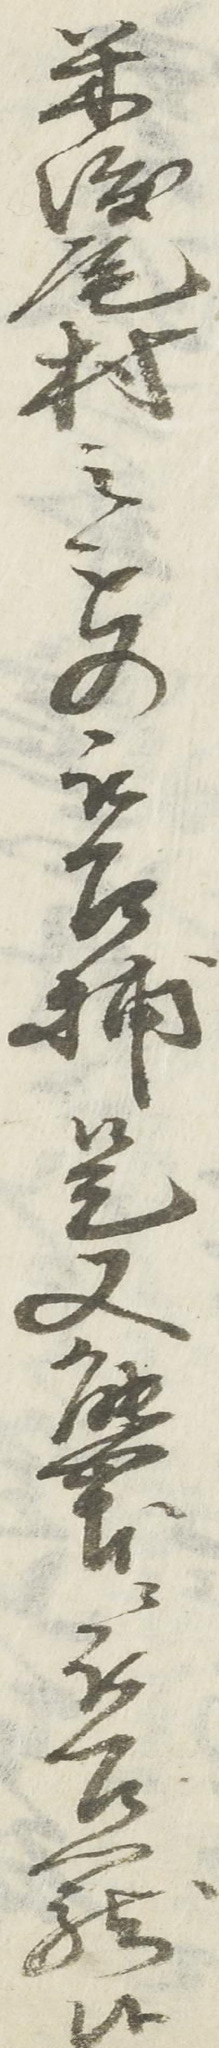米後尾村之もの被召捕是又熊本ニ被召寵候
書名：後見笑
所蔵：東京大学地震研究所図書室 Earthquake Research Institute Library, The University of Tokyo, JAPAN
